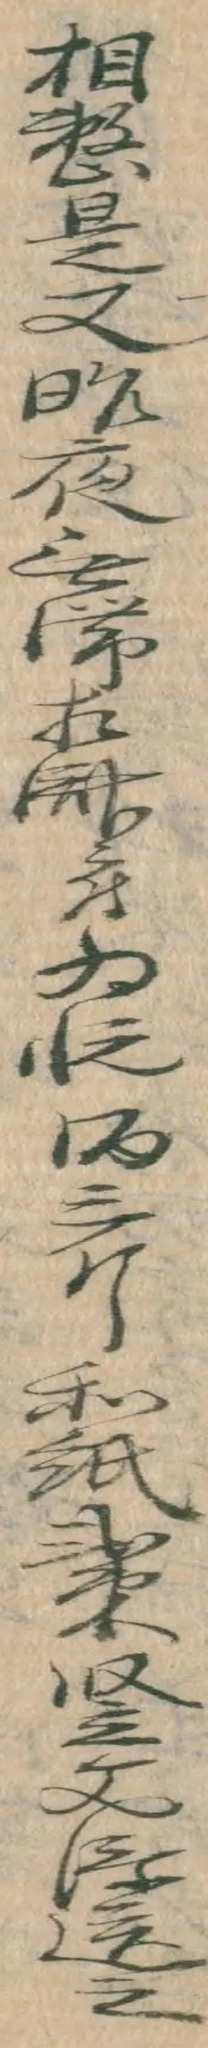相整是又昨夜無滞相済候ニ付為祝酒三升和紙弐束竪文添送之
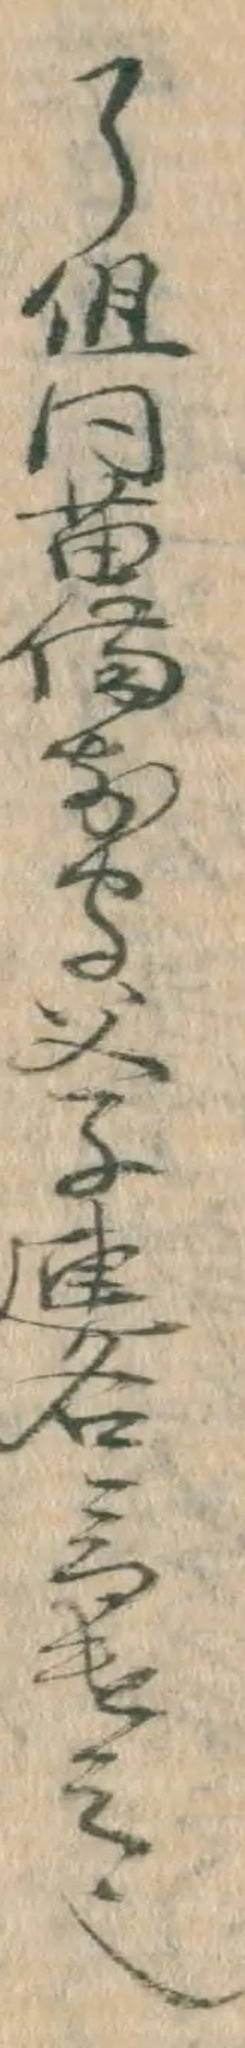了但同苗備前守父子連名ニ而遣之也
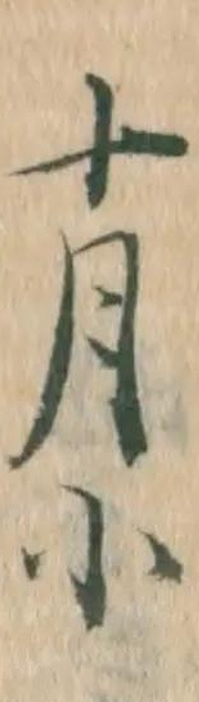十月小
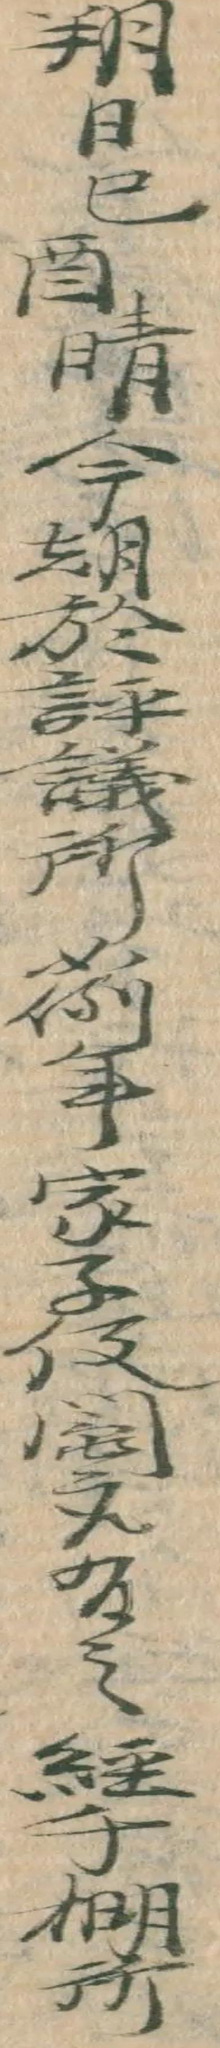朔日巳酉晴今朝於評議所如例年家子役鬮取有之経千棚所
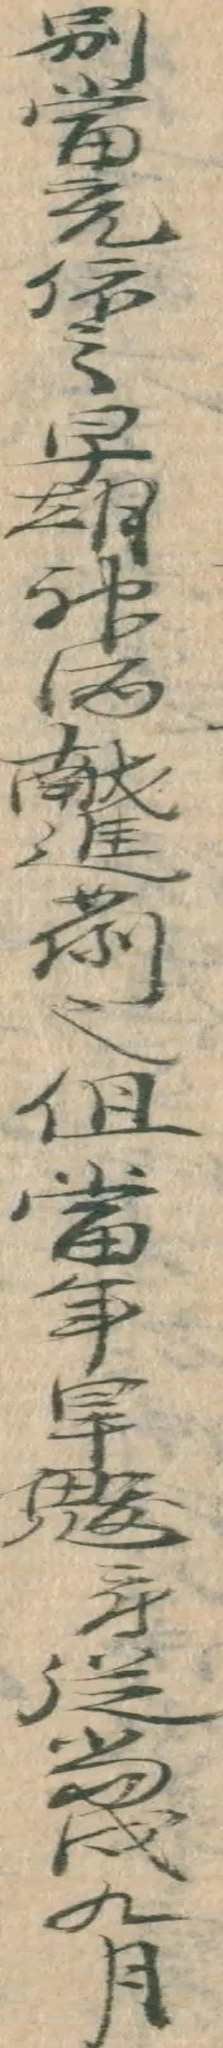別當充依之早朝神酒献進如例也但當年旱魃ニ付従當戌九月
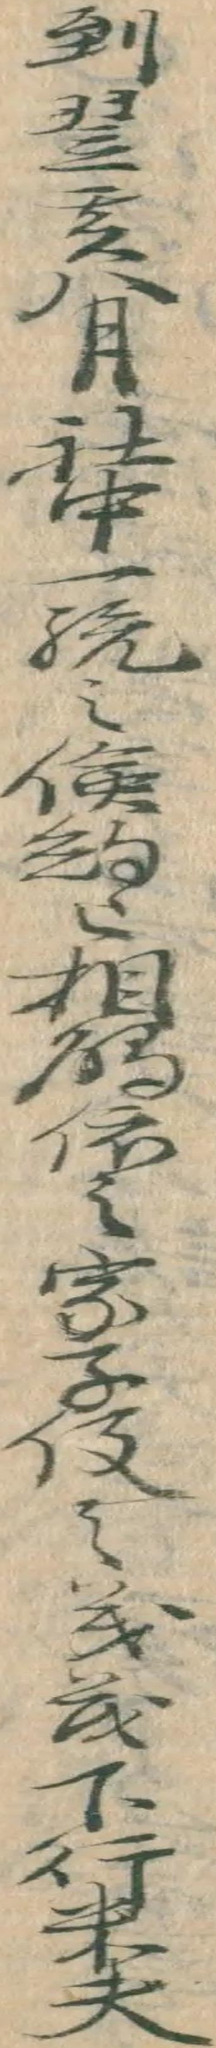利翌亥八月社中一統之倹約被相触依之家子役之義も下行米夫
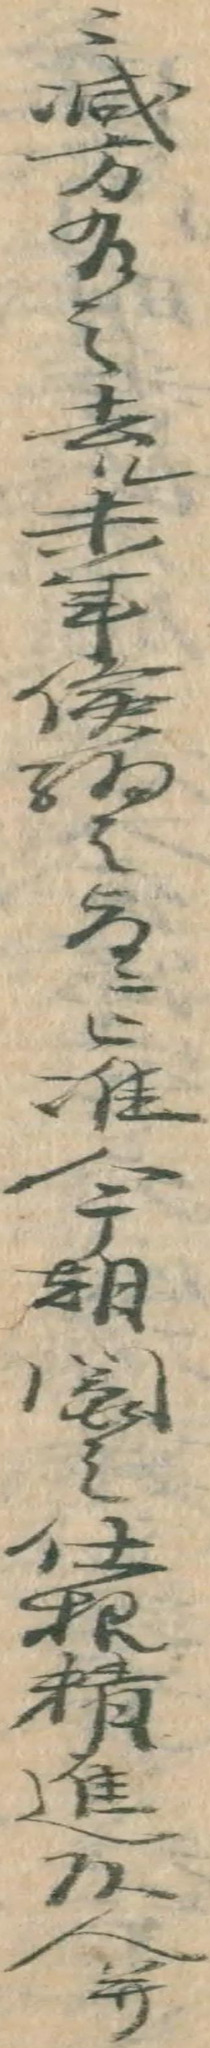々減方有之去ル未年倹約之旨ニ被准今朝鬮之仕様精進頭人并
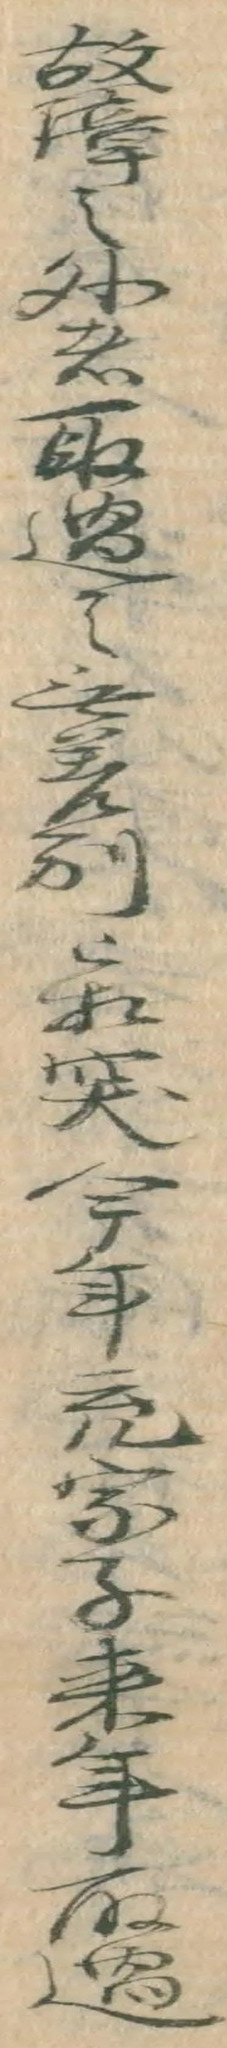故障之外者取過之無差別被相突今年充字子来年取過

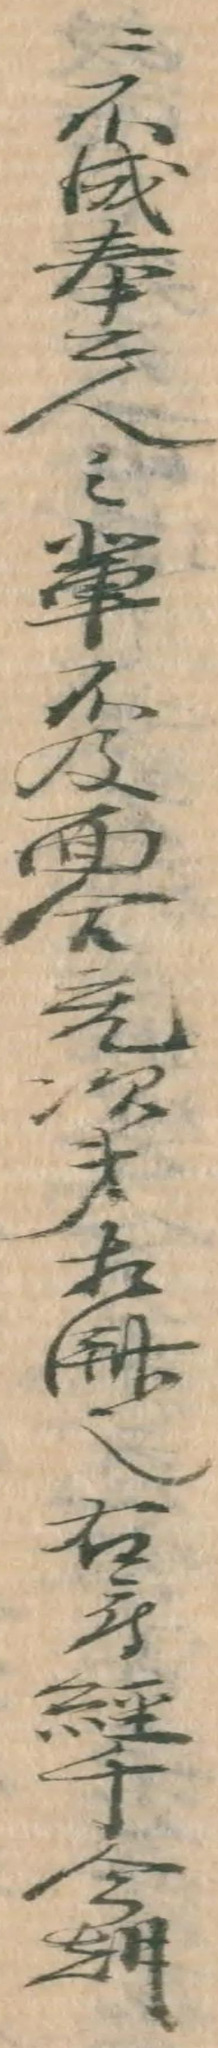ニ不成奉公人之輩不及面合充次第相済也右ニ付経千今期
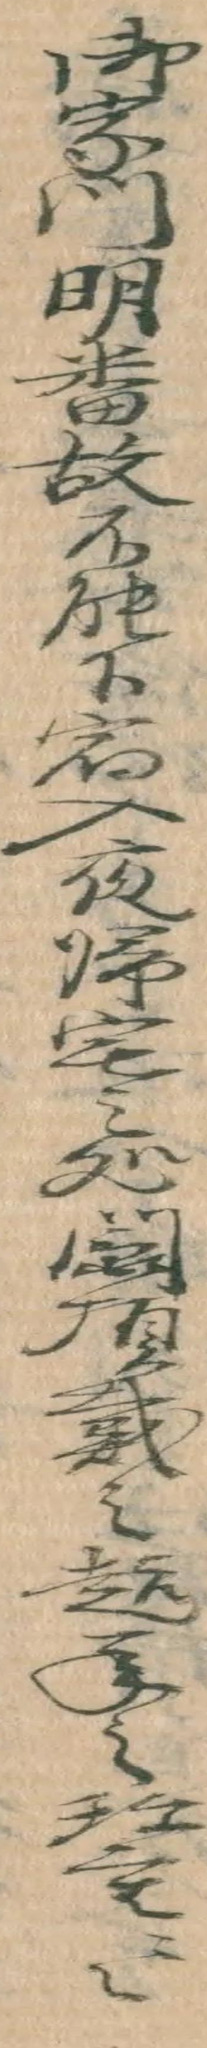御家門明番故不能下宿入夜帰宅之処鬮頂戴之趣承之珍重々々
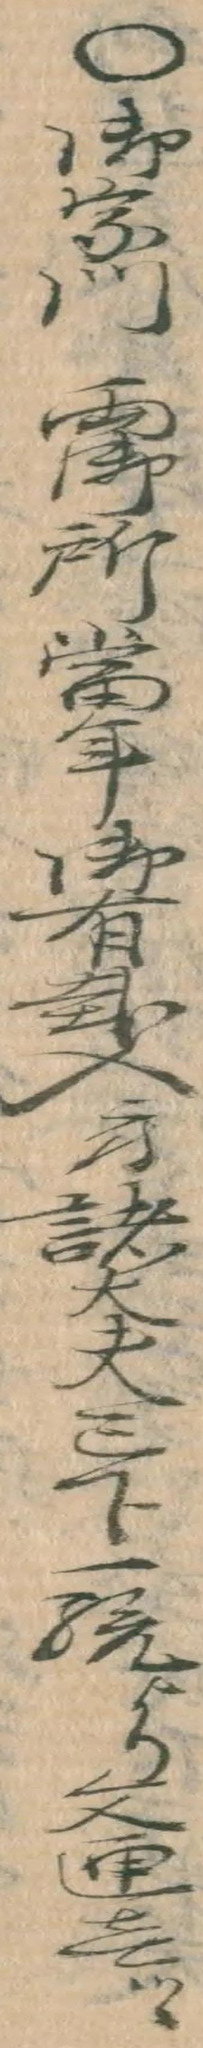○御家門両御所當年御有卦入ニ付諸大夫已下一統より文匣壱ツヽ
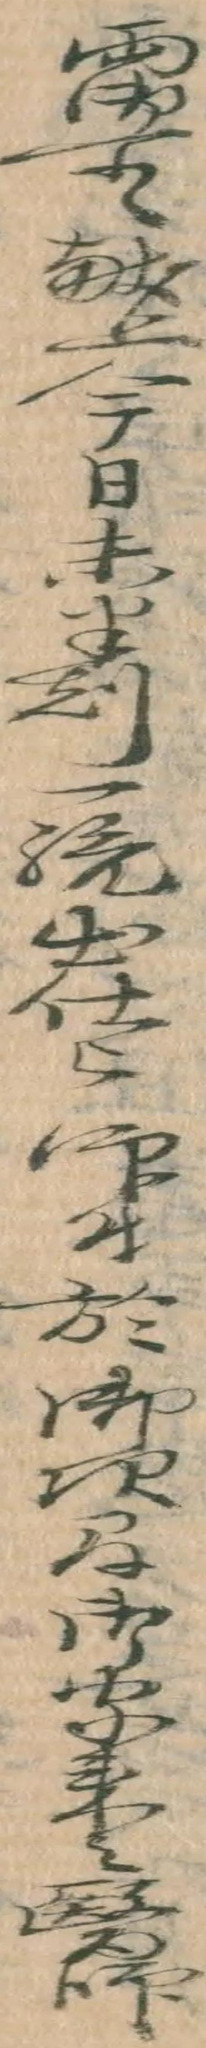両御所へ献上今日未半刻一統出仕被仰付於御次間御家来之醫師
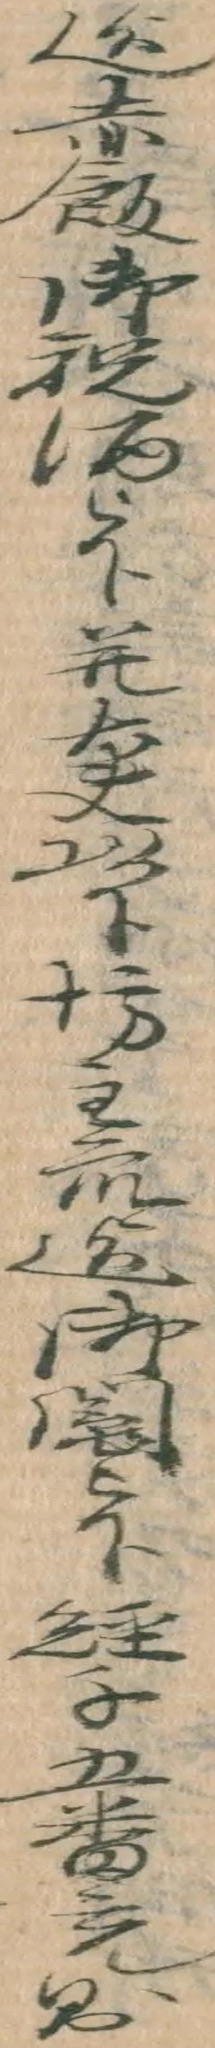迄赤飯御祝酒被下并大夫以下坊主衆迄御鬮被下経千五番宛
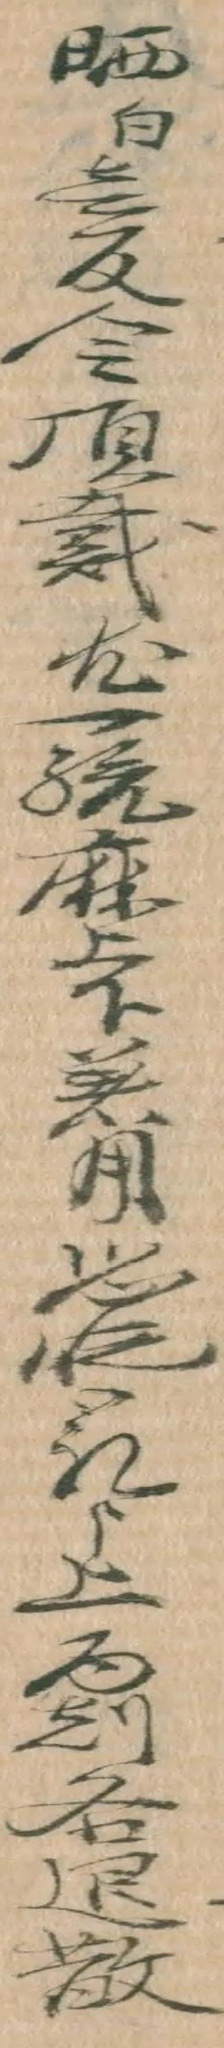晒白壱反令頂戴尤一統麻上下着用恐悦御礼申上酉刻各退散
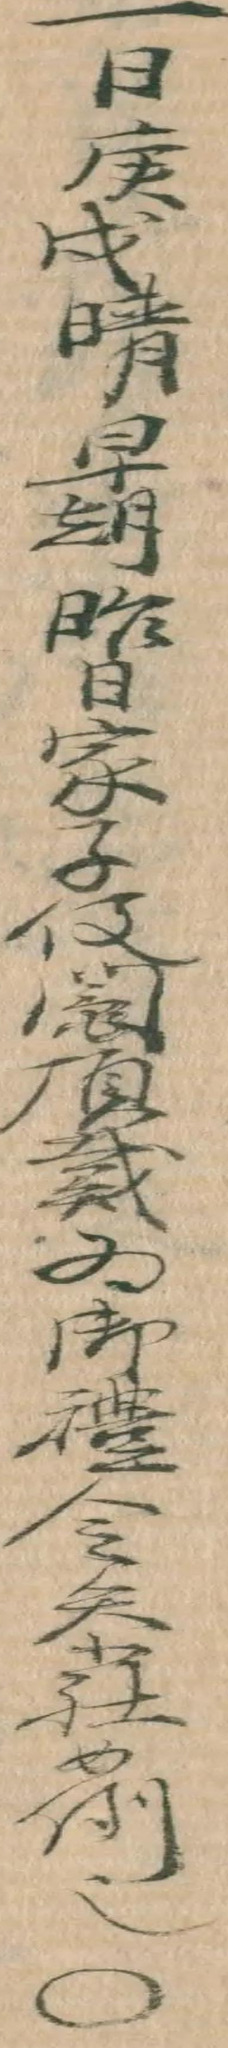二日庚戌晴早朝昨日家子役鬮頂戴為御禮令参社如例也○
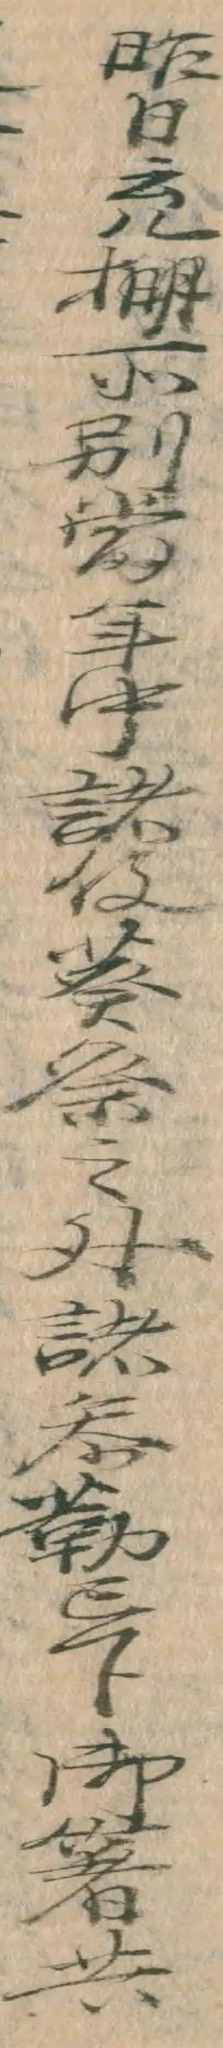昨日充棚所別當年中諸役葵祭之外諸参勤已下御箸共
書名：賀茂社記録. 第65冊
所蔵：国立国会図書館 National Diet Library, JAPAN
